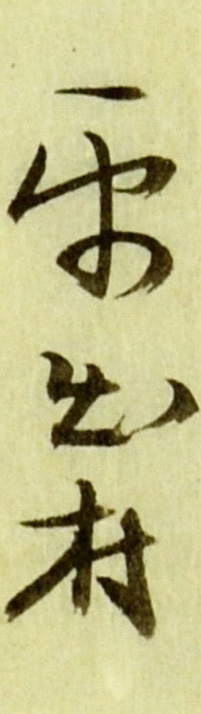平出村
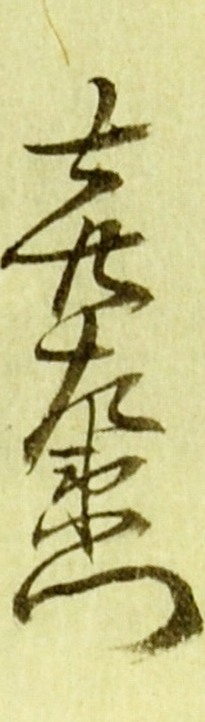喜左衛門
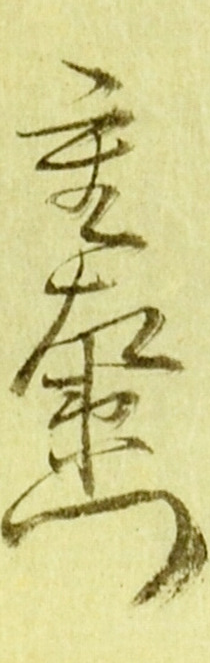重左衛門
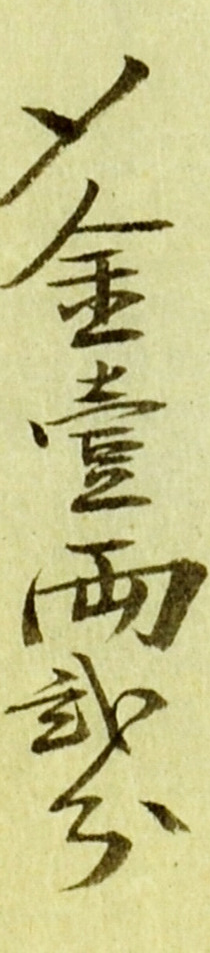〆金壱両弐分
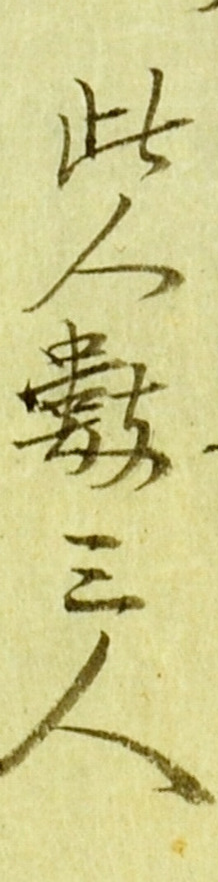此人数三人
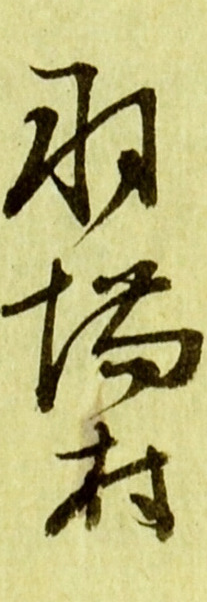羽場村
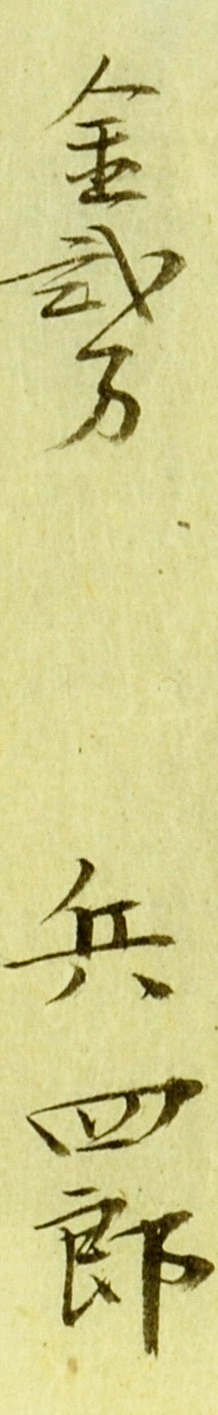金弐分兵四郎
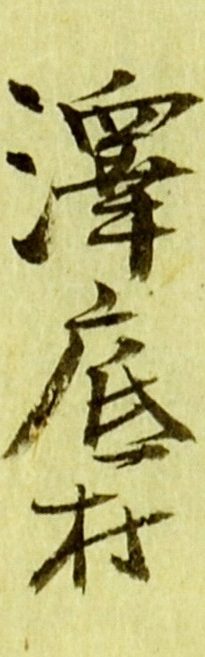沢底村
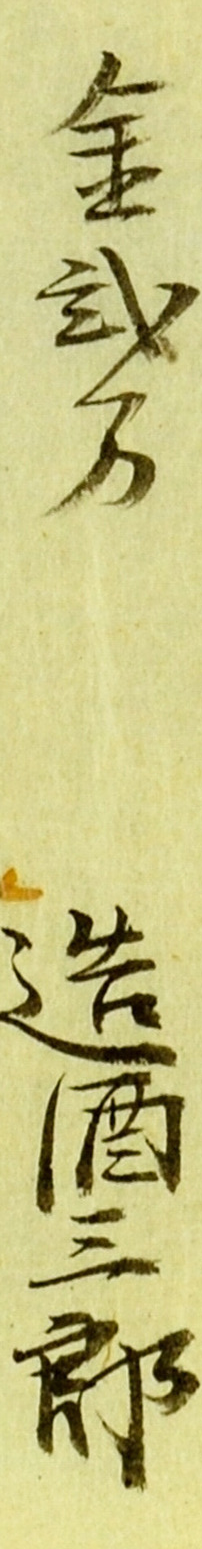金弐分造酒三郎
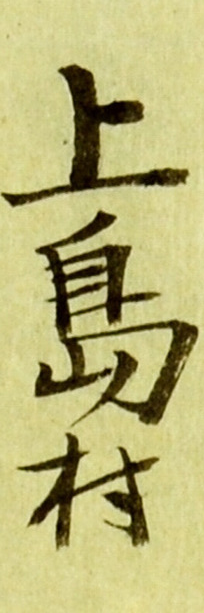上島村
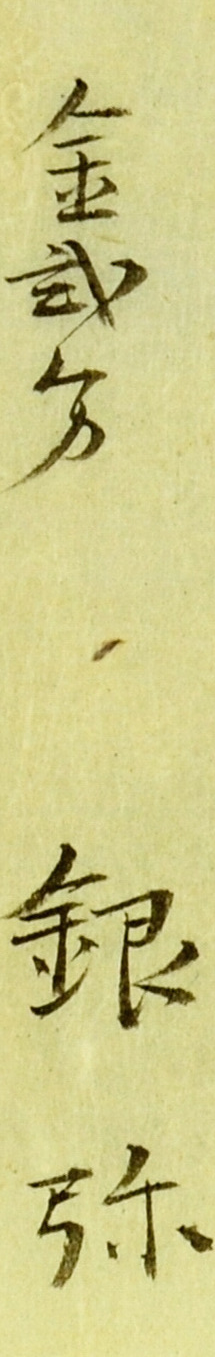金弐分銀弥
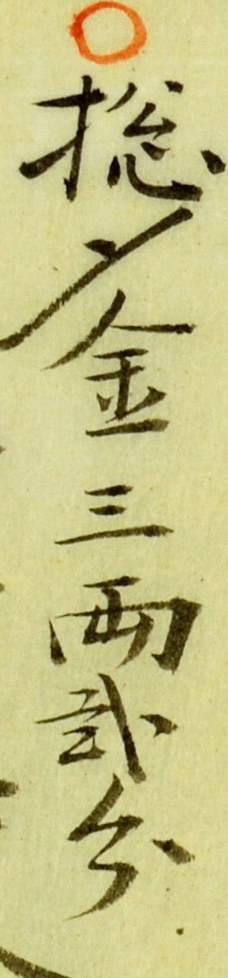〇総〆金三両弐分
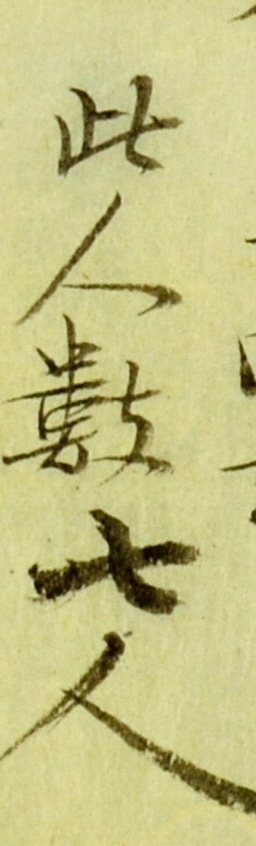此人数七人

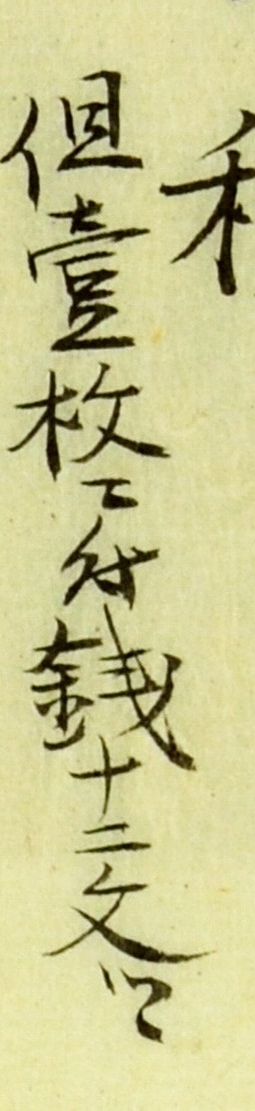但壱枚ニ付銭十二文ツゝ
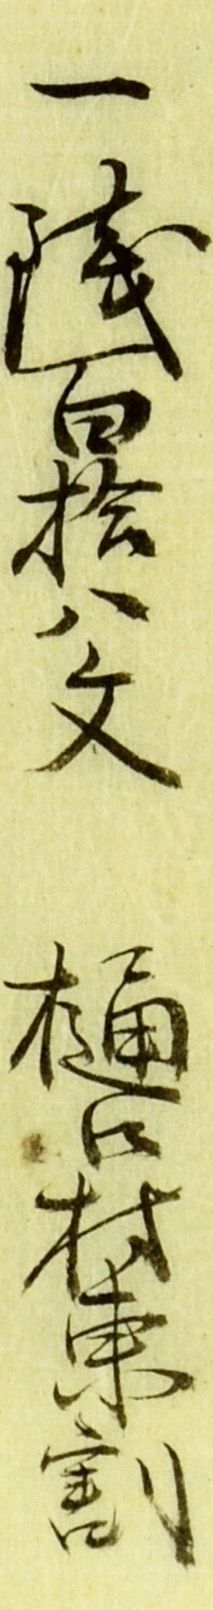一銭百拾八文樋口村東割
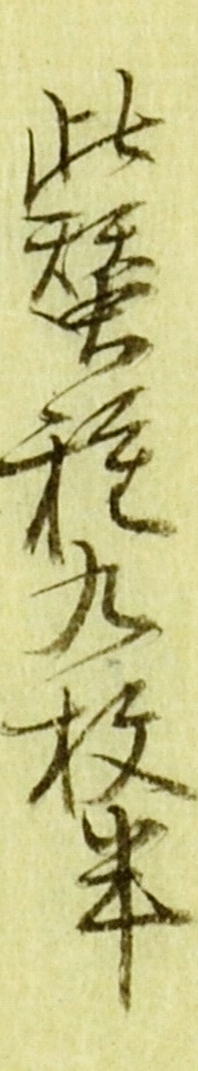此蚕種九枚半
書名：上伊那郷諸運上取調帳
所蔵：伊那市立高遠町図書館・合同会社AMANE
